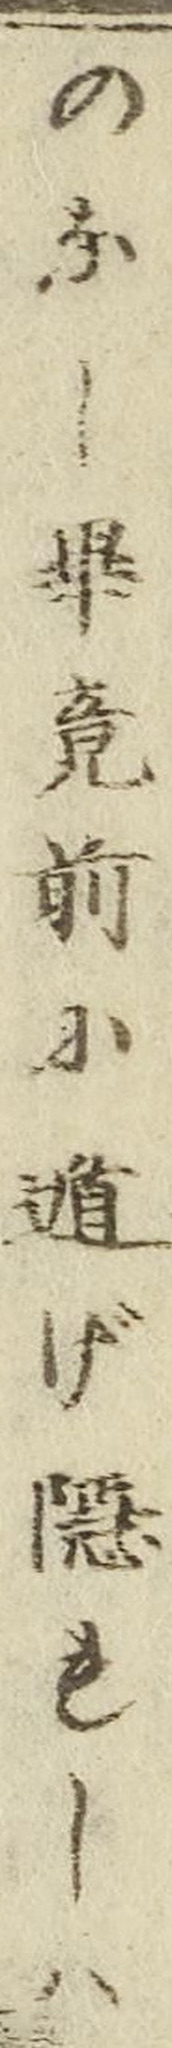のなし畢竟前に遁げ隠れしは
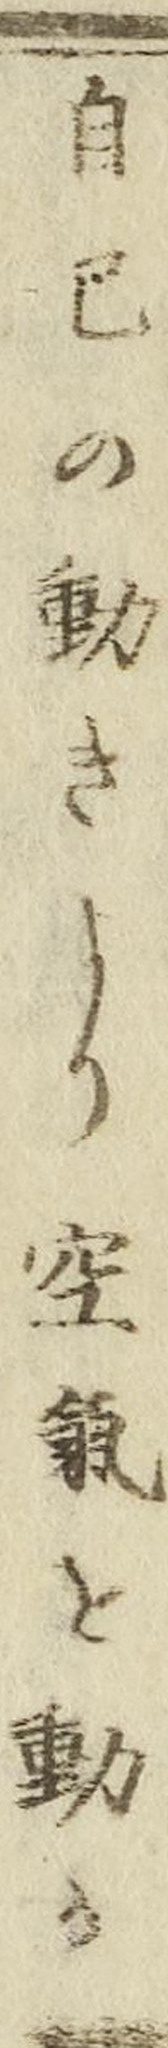自己の動きより空気を動か
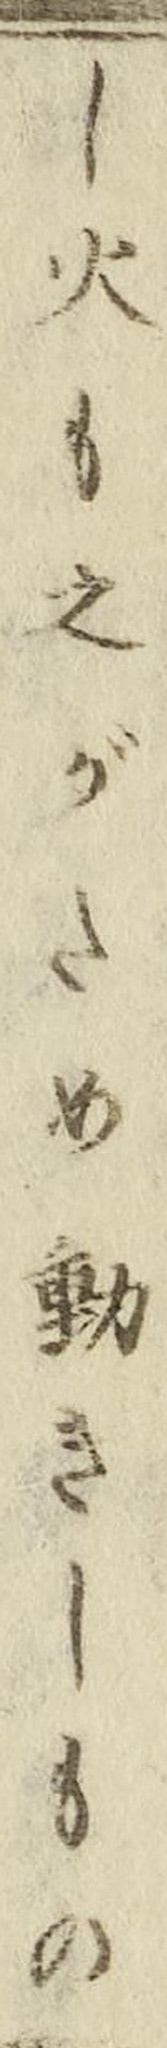し火も之がため動きしもの
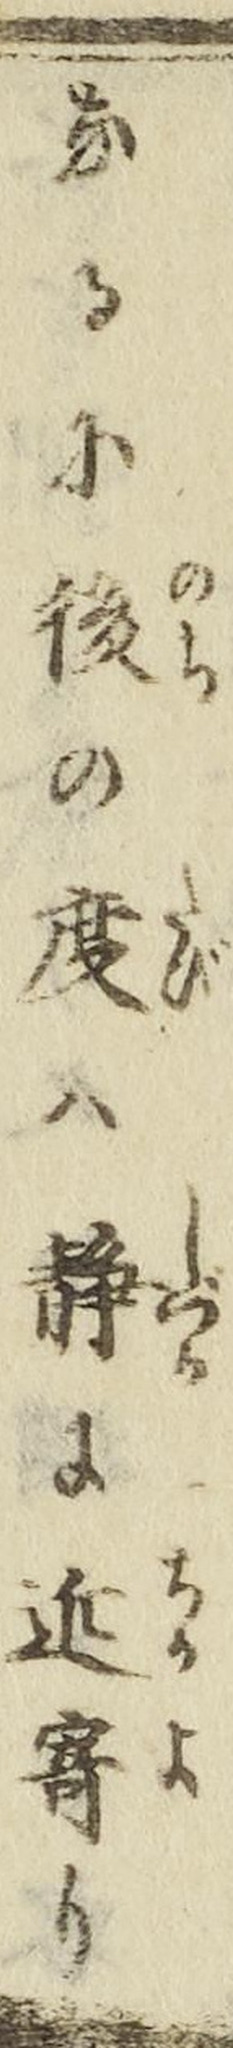なるに後の度は静に近寄り
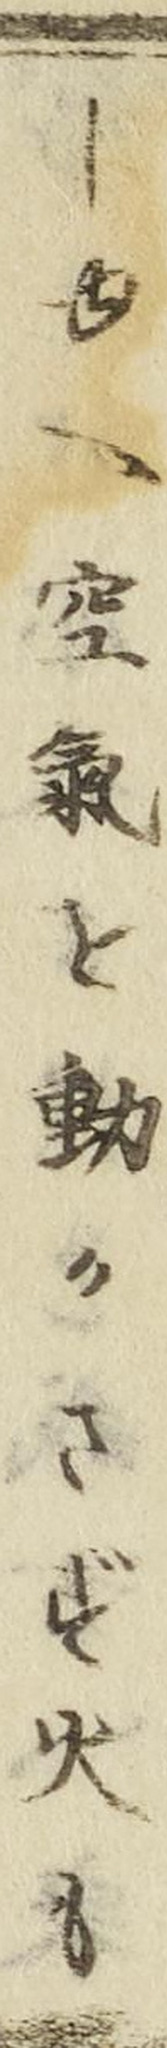しゆへ空気を動かさず火も
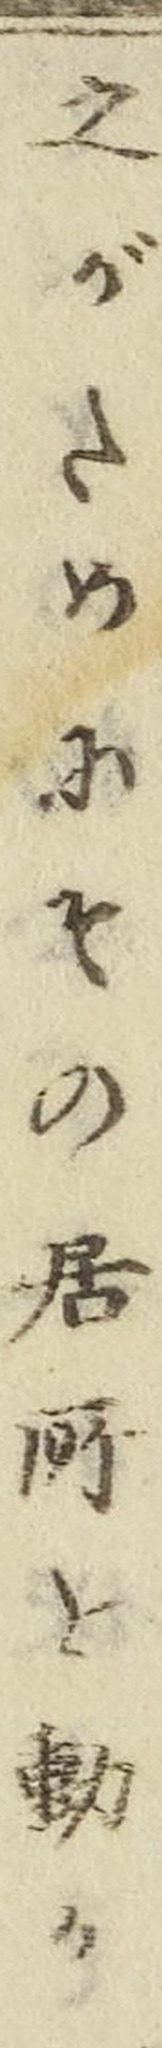之がためにその居所を動か
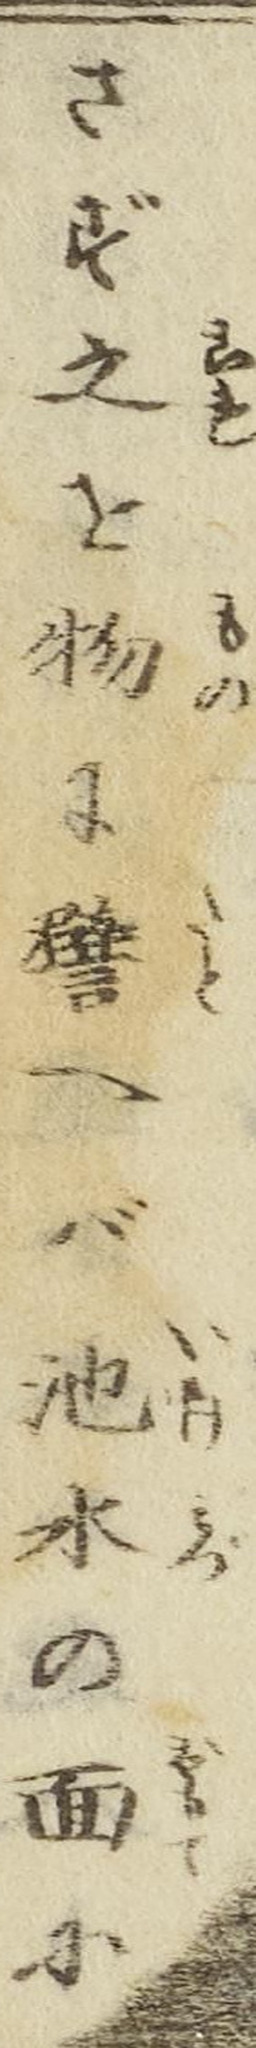さず之を物に譬へば池水の面に

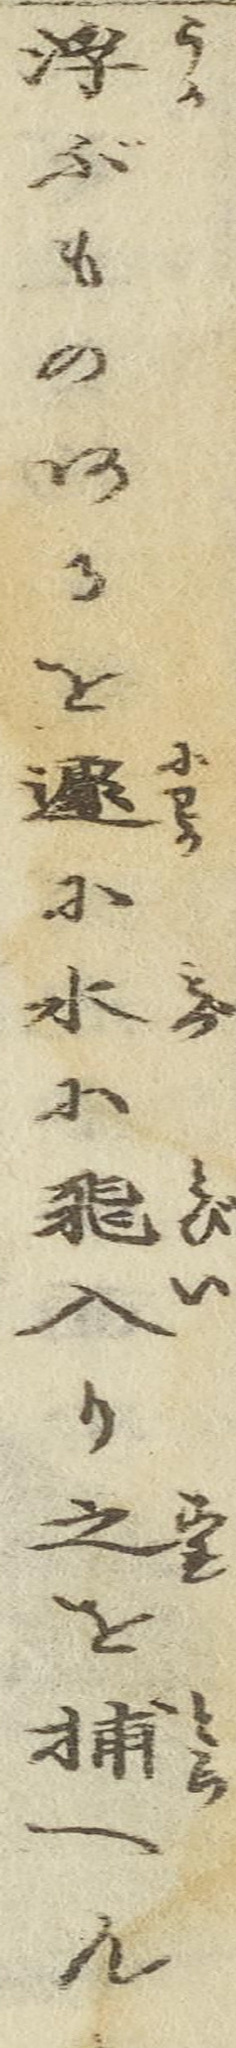浮ぶものあるを遽に水に飛入り之を捕へんと
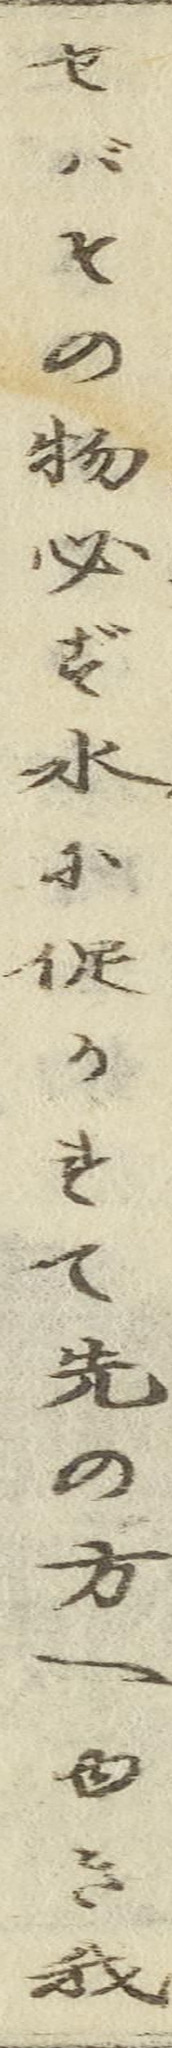せばその物必ず水に促かれて先の方へゆき我
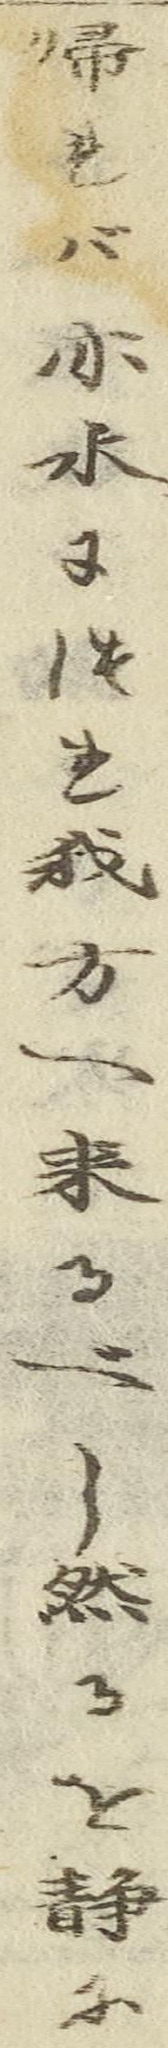帰れば亦水につれ我方へ来るべし然るを静に
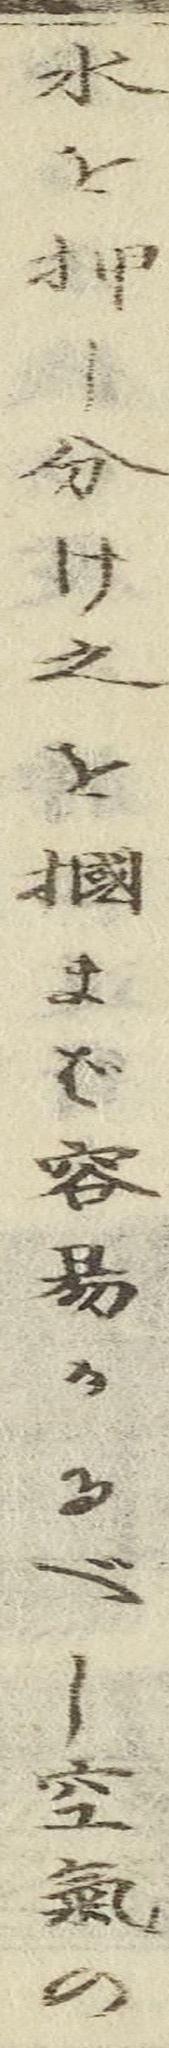水を押し分け之を掴まば容易かるべし空気の
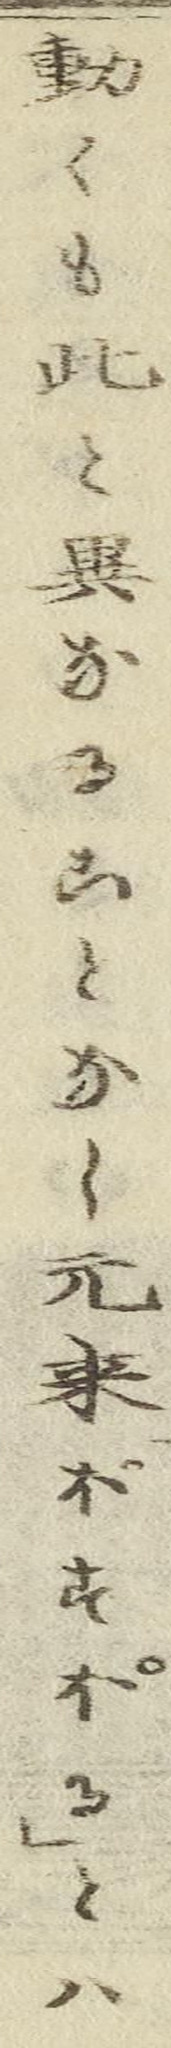動くも此と異なることなし元来「ぽすぽる」とは
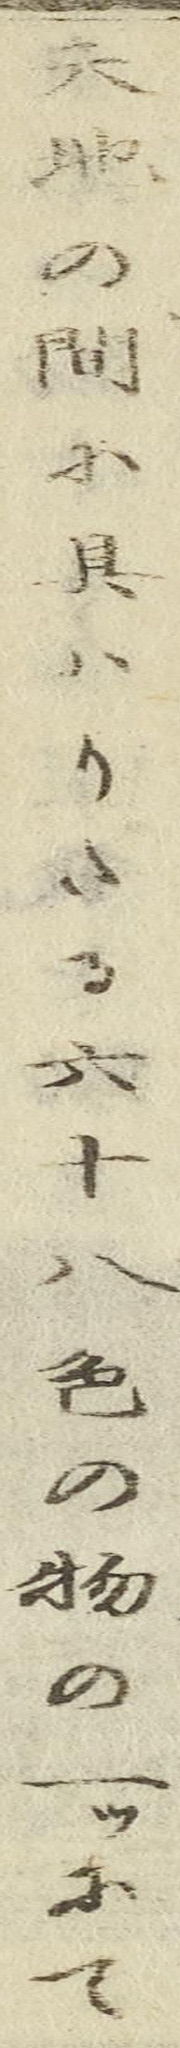天地の間に具はりたる六十八色の物の一つにて
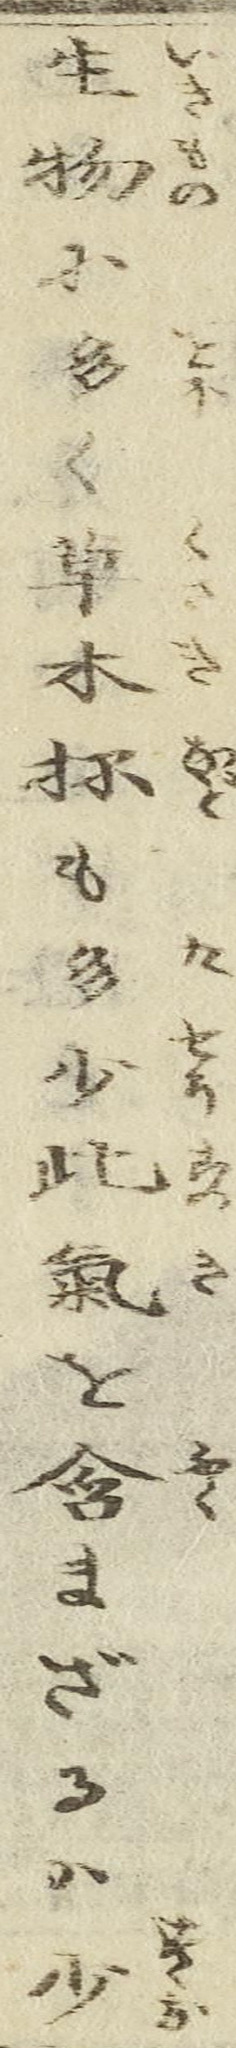生物に多く草木抔も多少此気を含まざるは少
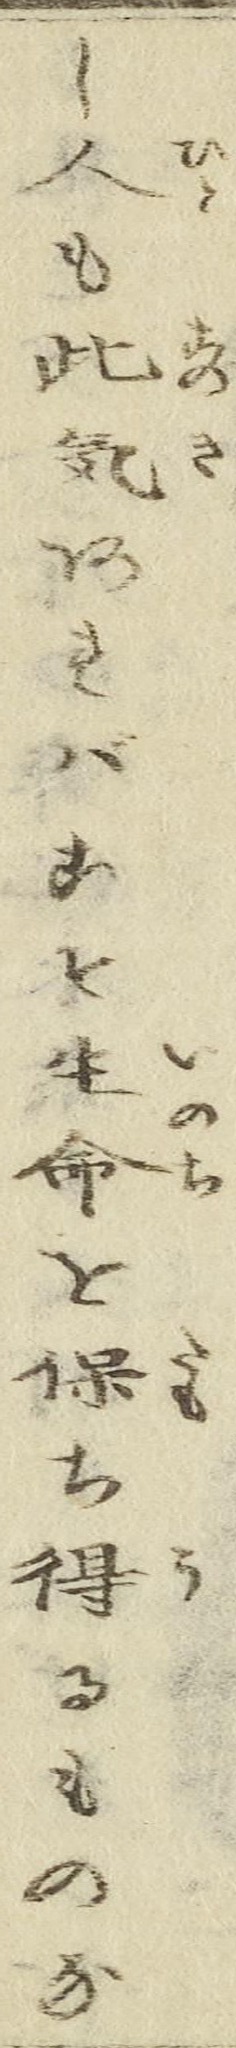し人も此気あればこそ生命を保ち得るものな
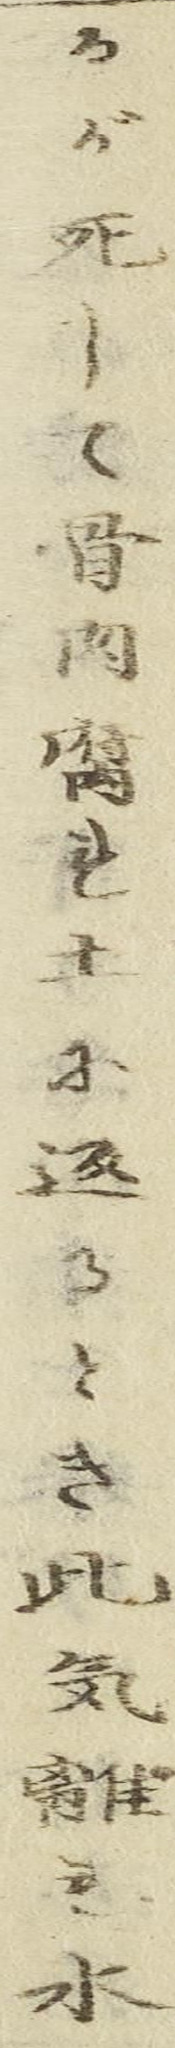るが死して骨肉腐れ土に返るとき此気離れ水
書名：天変地異
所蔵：東京大学地震研究所図書室 Earthquake Research Institute Library, The University of Tokyo, JAPAN
